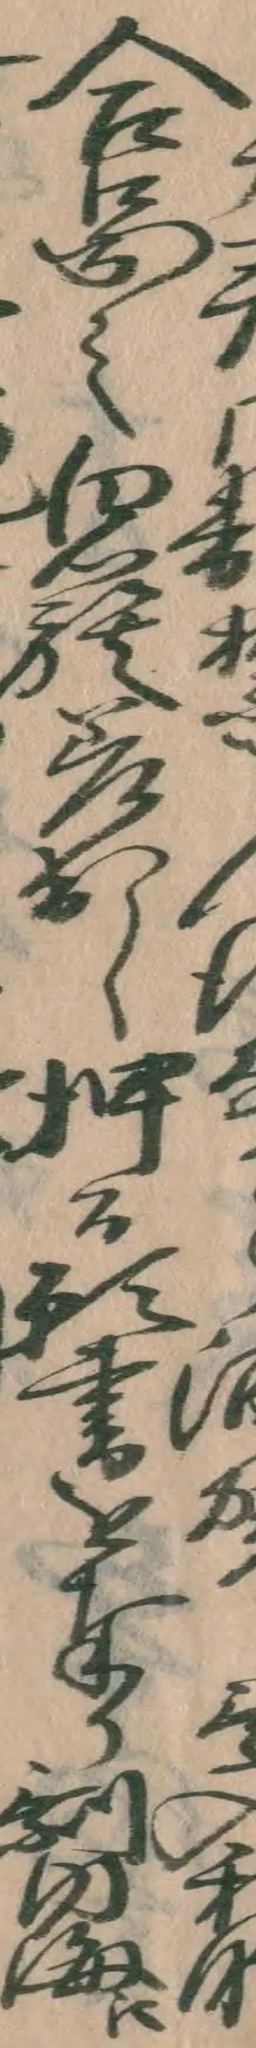合圖之白籏差出し押而願書を奉り剰内海江
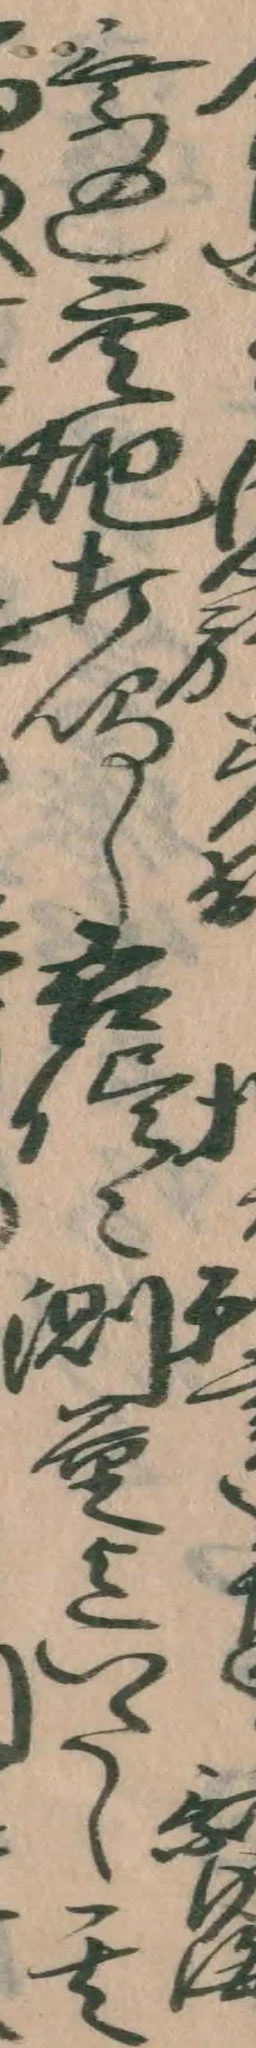乗込空砲打鳴し吾儘之測量迄いたし其
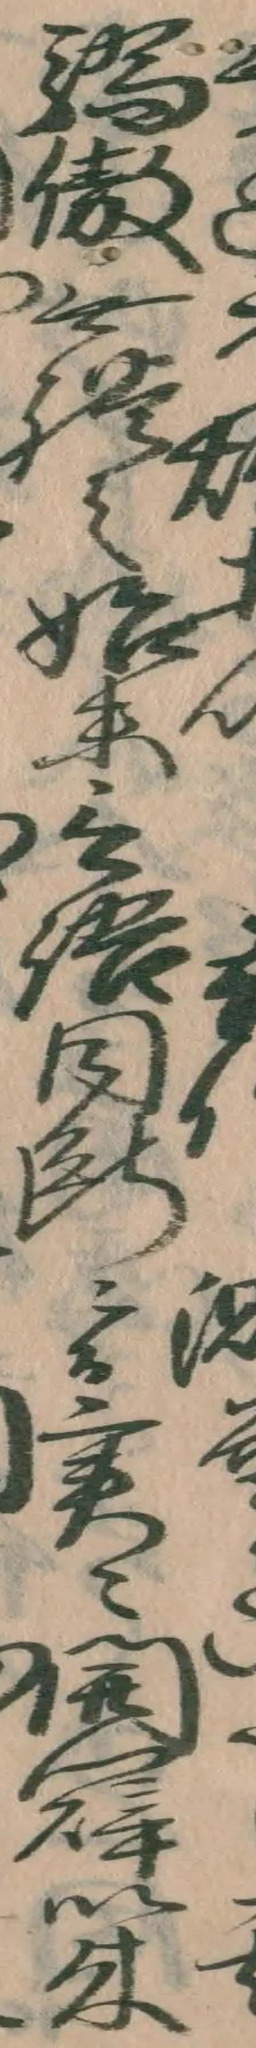驕傲無禮之始末言語同断二而実ニ開闢以来
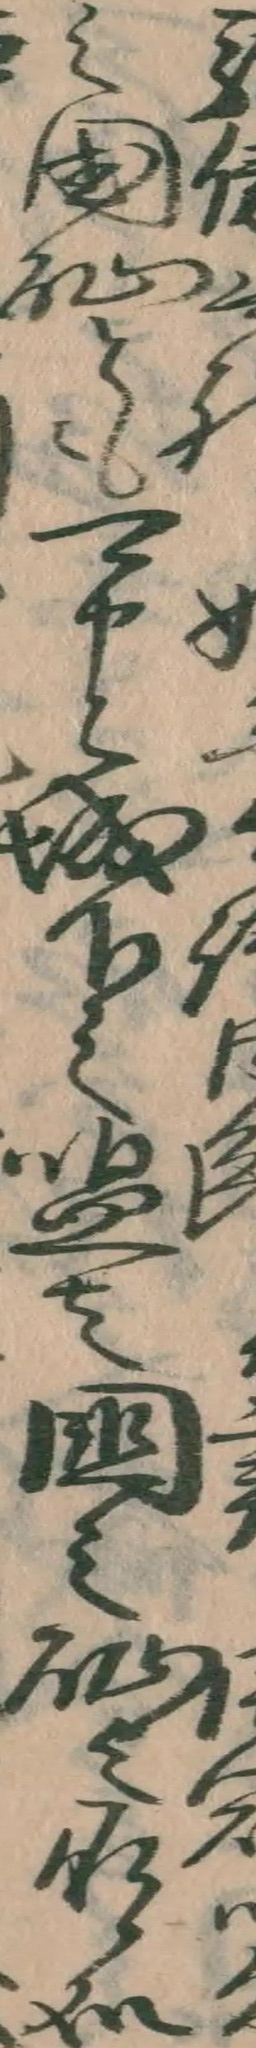之国恥とも可申と城下之盟者国之恥と承候処
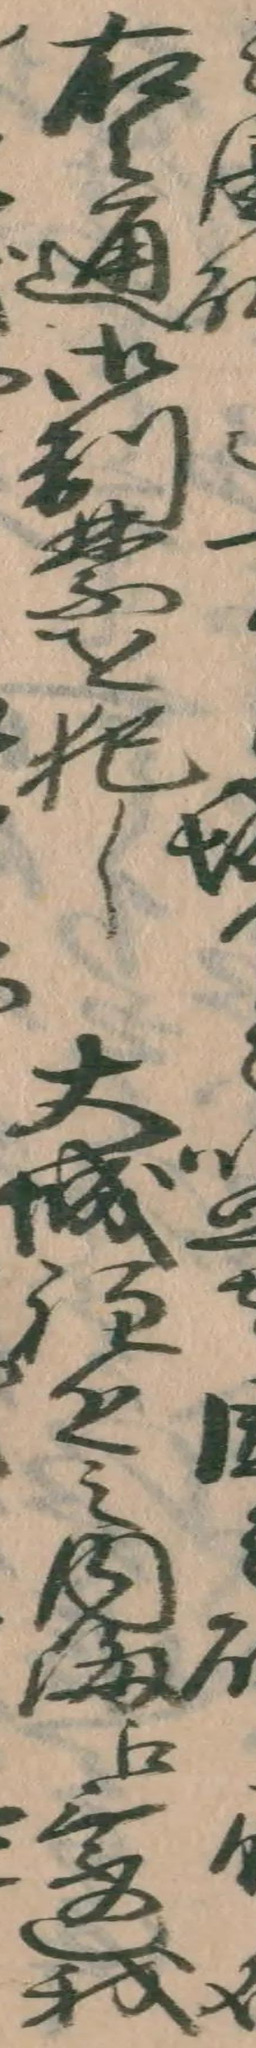右之通御制禁を犯し大城程近之内海江乗込我
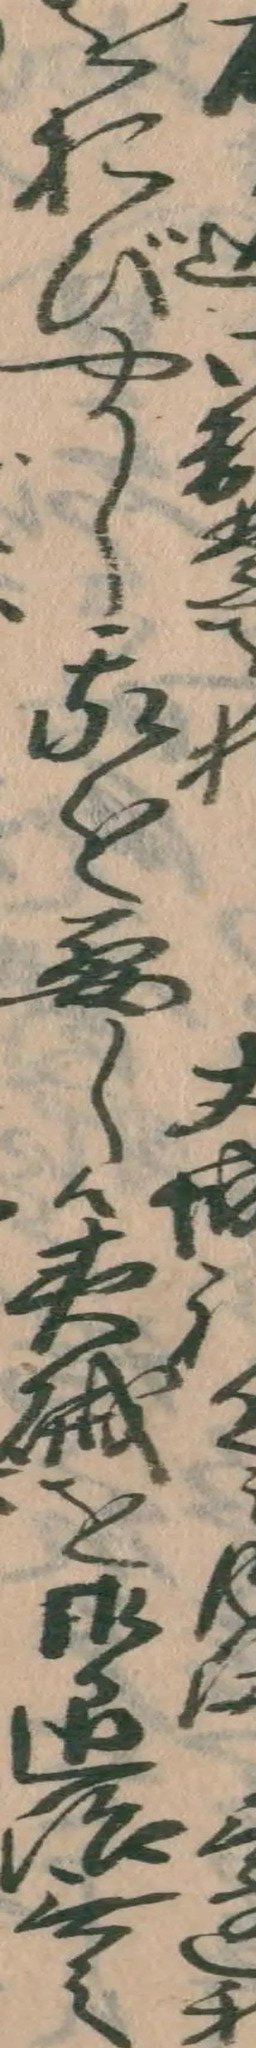をおびやかし我を要し候夷賊を御退治無之
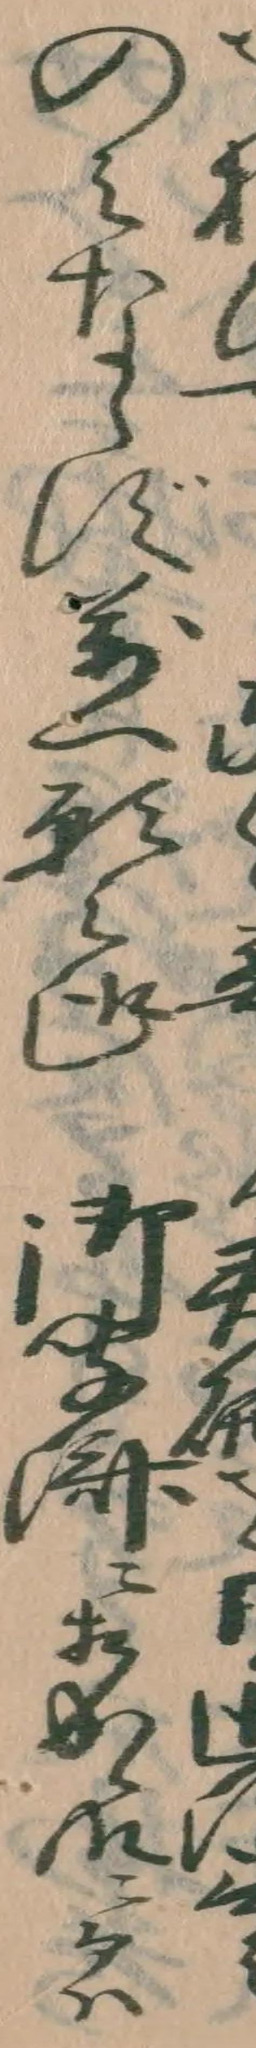のミならず萬一願之趣御聞濟ニ相成候様二而ハ
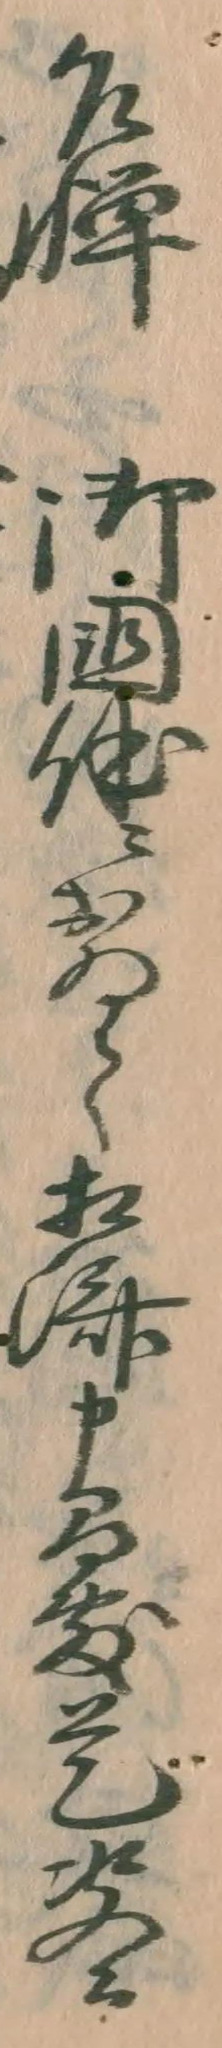乍憚御国体ニおゐて相濟申間敷決而
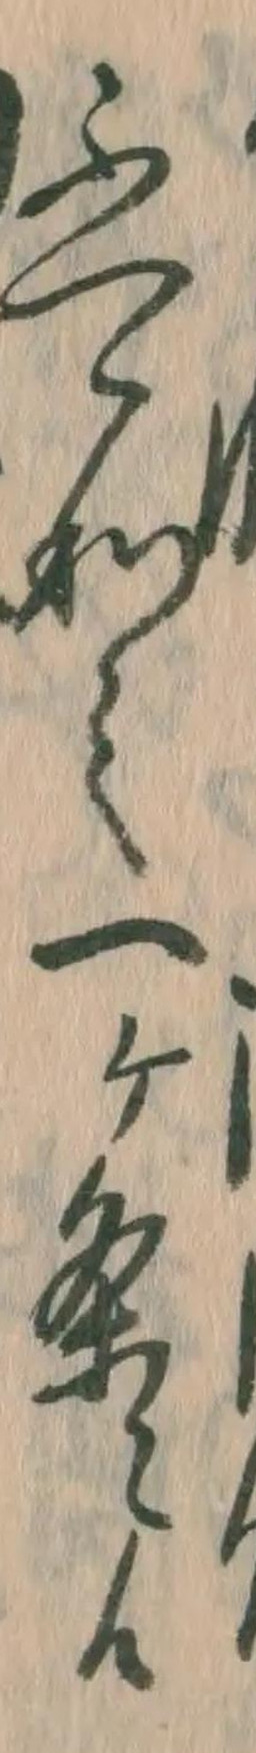不可和之一ケ条ニ候
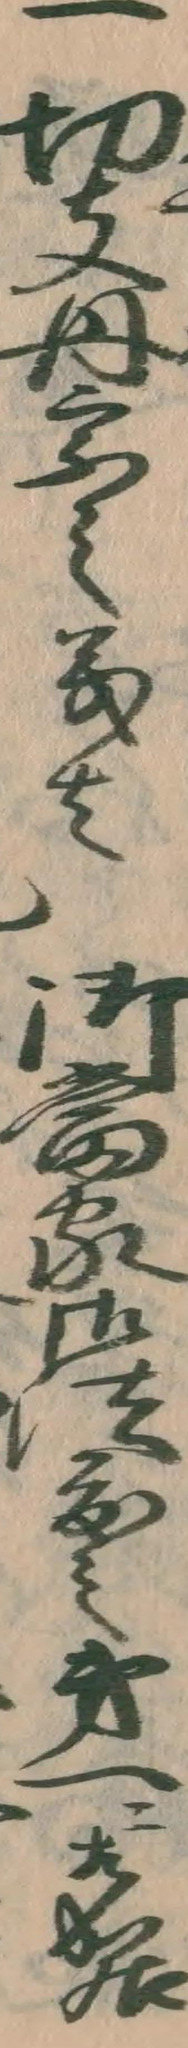一切支丹宗之義者御當家御法度之第一ニ相成居
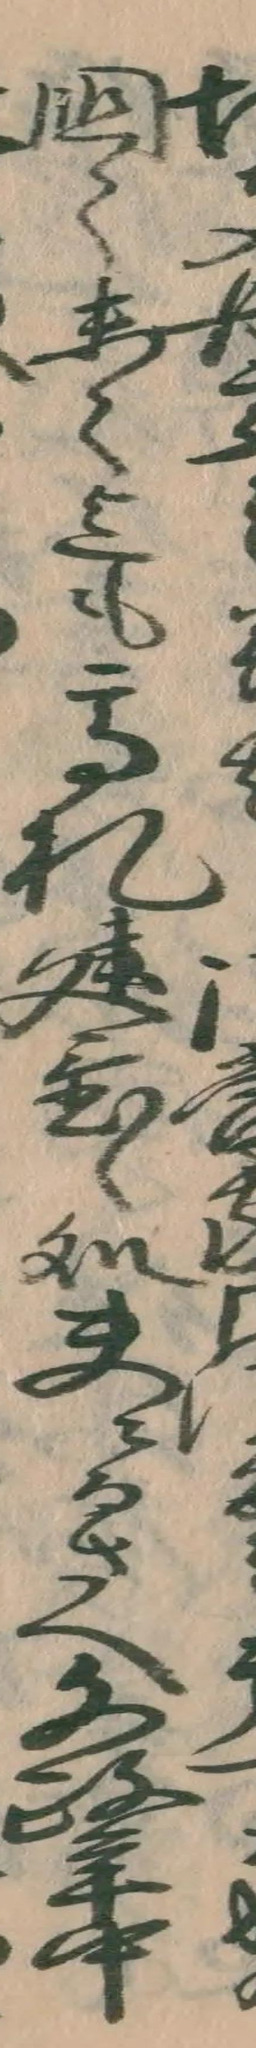国々末々迄も高札建置候処夫ニ而さへ文政年中
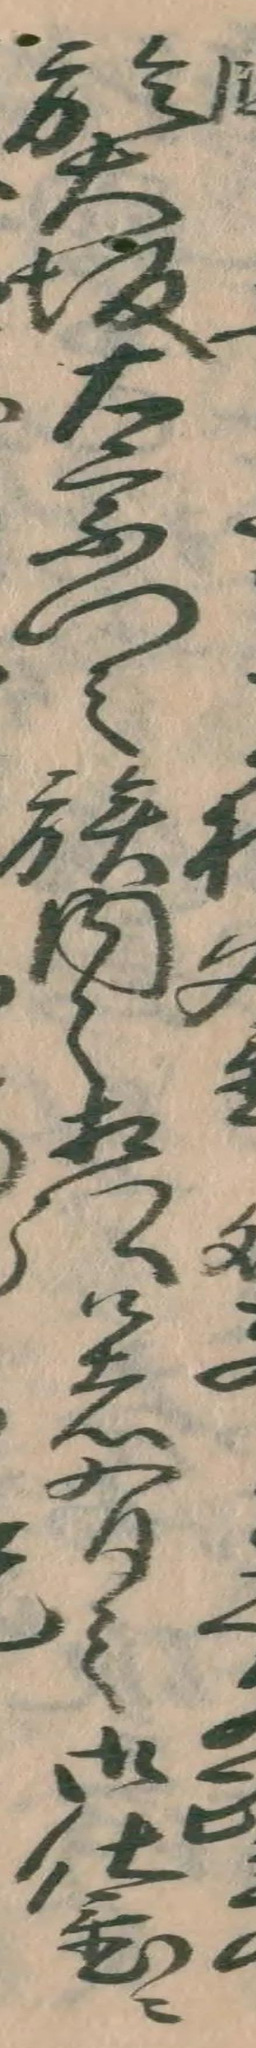於大坂右宗門之族内之相弘候者有之御仕置ニ
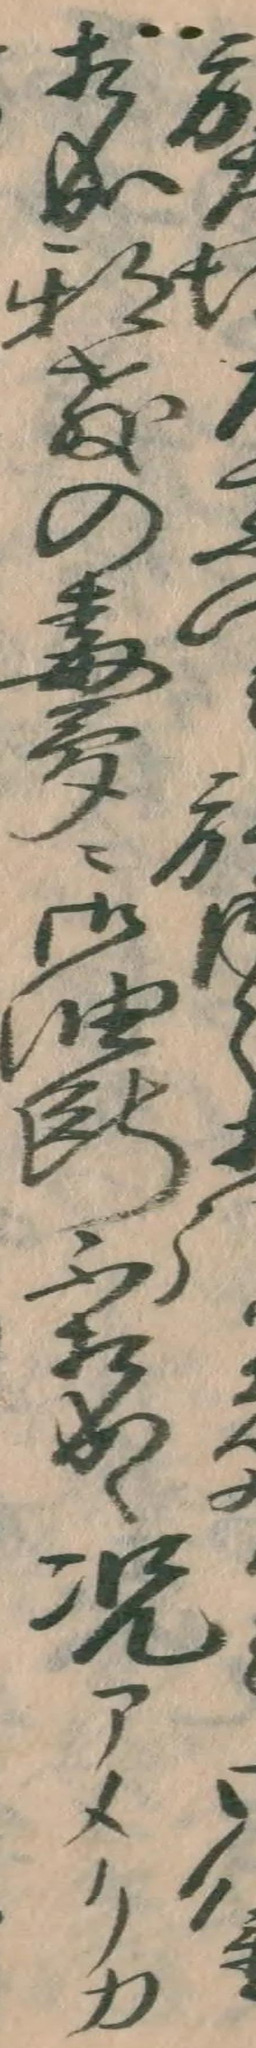相成邪教の毒夢ニ御油断不相成候况アメリカ
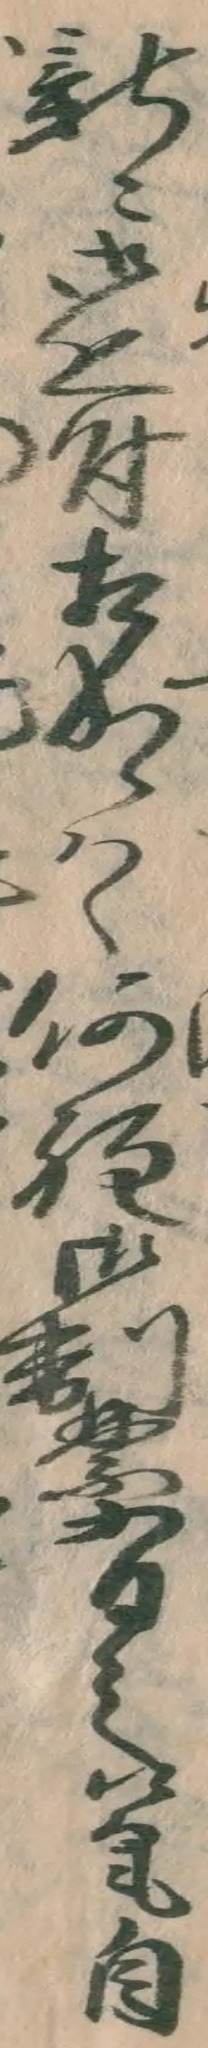新ニ御近付相成候ハヽ何程御制禁有之候而も自
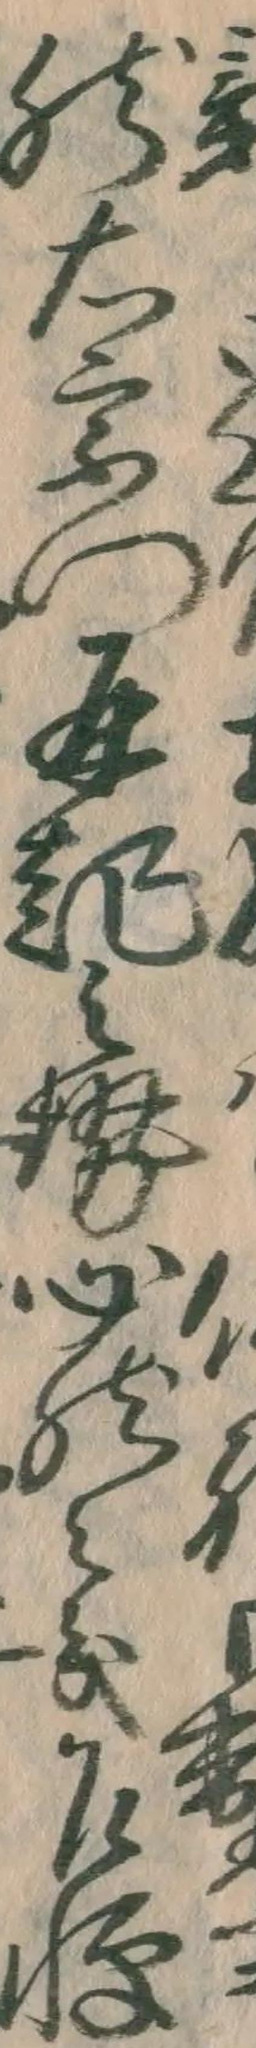然右宗門再起之勢必然之義乍憚
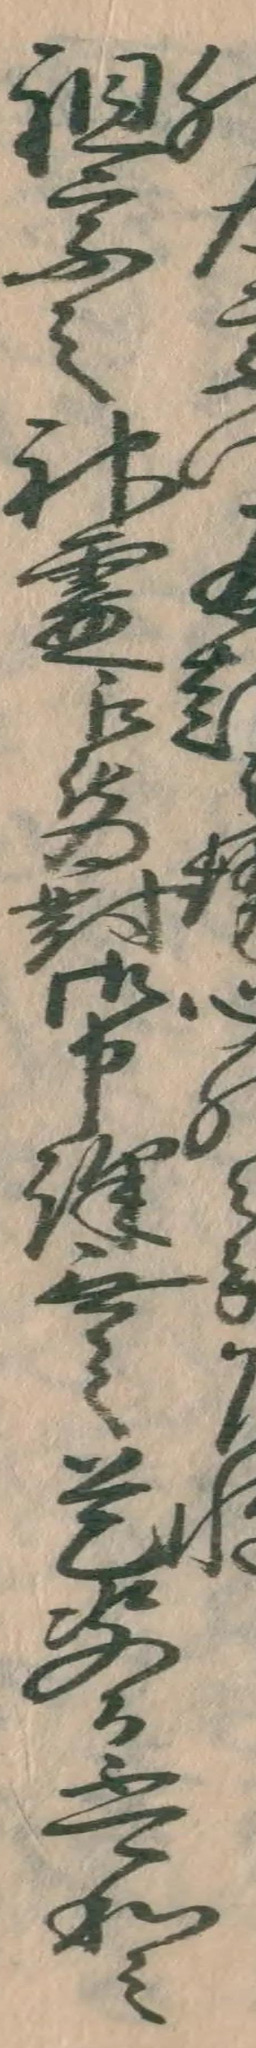租宗之神霊江被為對御申譯無之是決而不可和之
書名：麗斎叢書. 20
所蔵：国立国会図書館 National Diet Library, JAPAN
